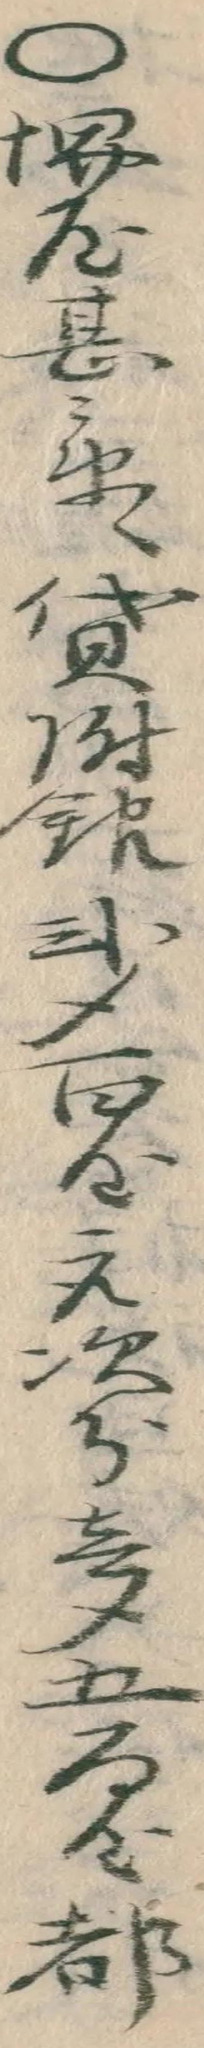○堺屋甚兵衛へ貸附銀弐〆百匁取次分壱貫五百匁都
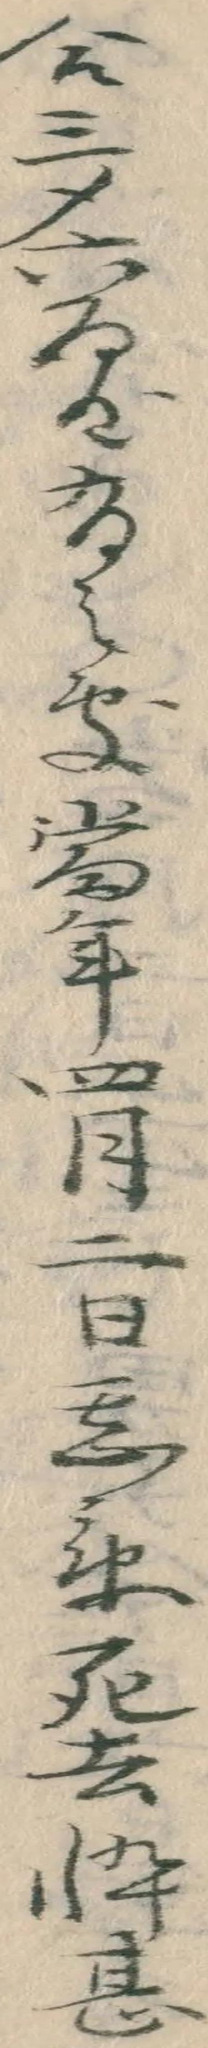合三〆六百匁有之處當年四月二日甚死去忰甚
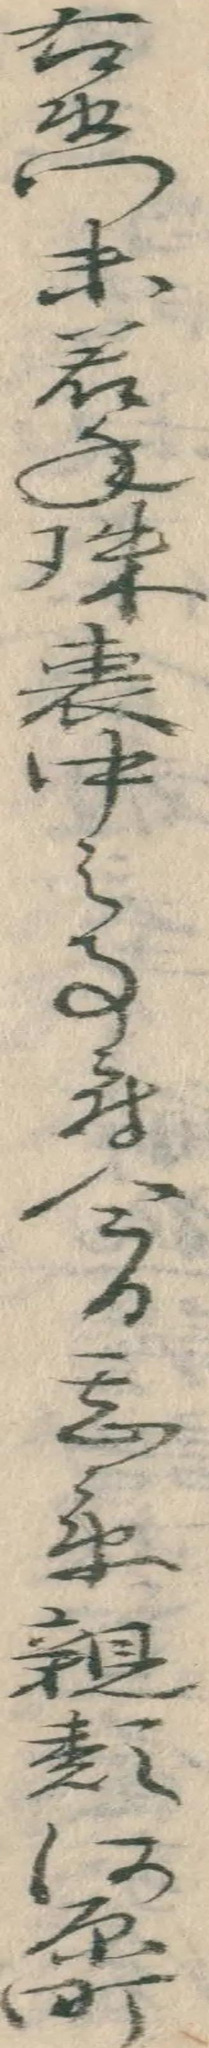右衛門未若年殊裏中之事ニ付今日甚兵衛親類河原町
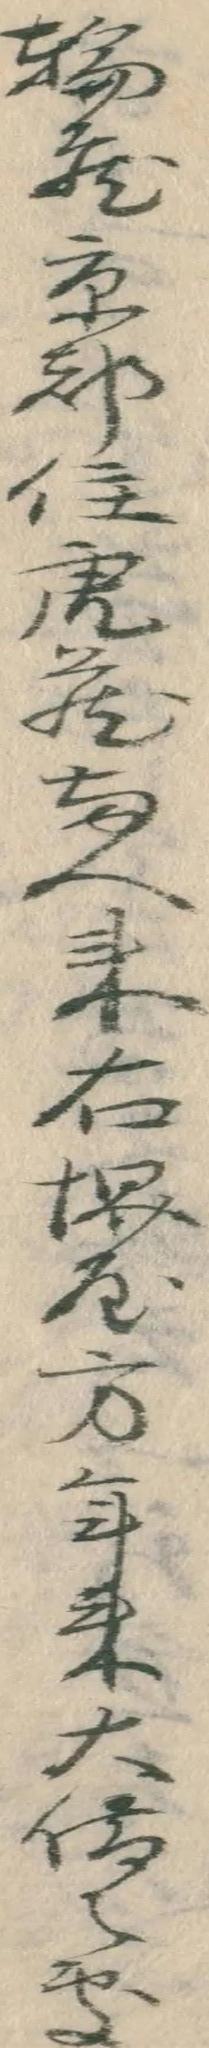輪蔵京都住虎蔵両人来右堺屋方年来大借之處
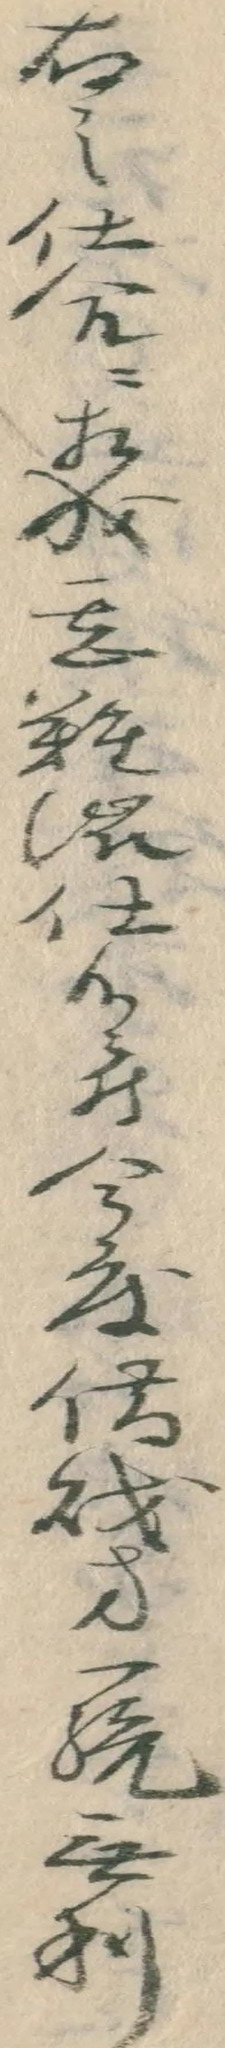右之仕合に相成甚難渋仕候ニ付今度借財方一統無利
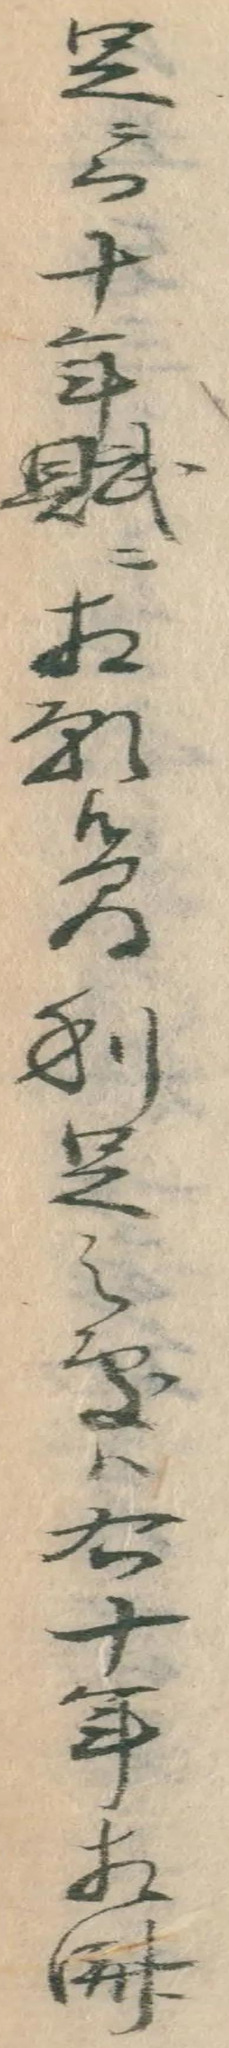足ニ而十年賦ニ相願候間利足之處ハ右十年相済

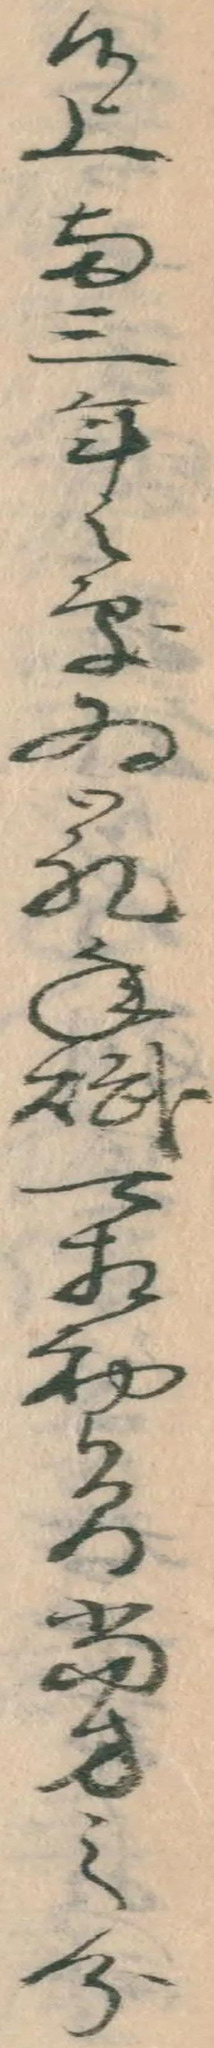候上両三年之處為御礼年賦可相勤候間当方之分
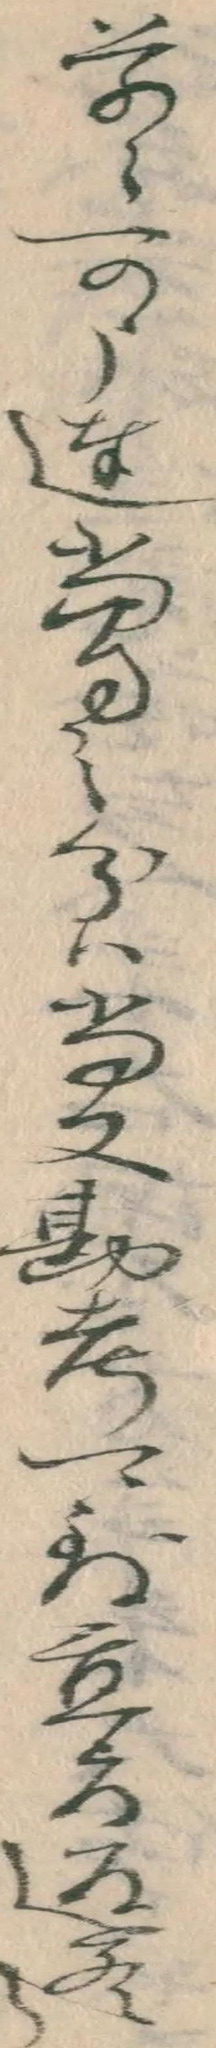前々可申達當方之分ハ尚又勘考可致置旨返答了
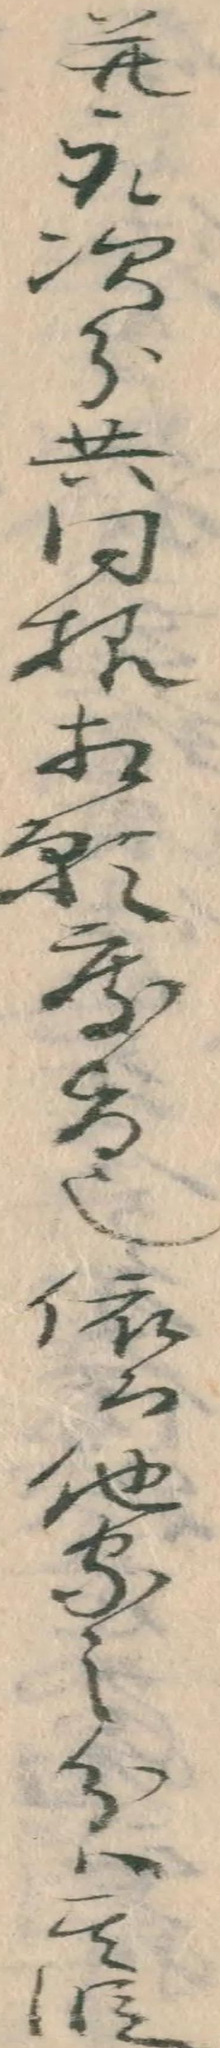并取次分共同様相願度旨也依而他家之分ハ其段
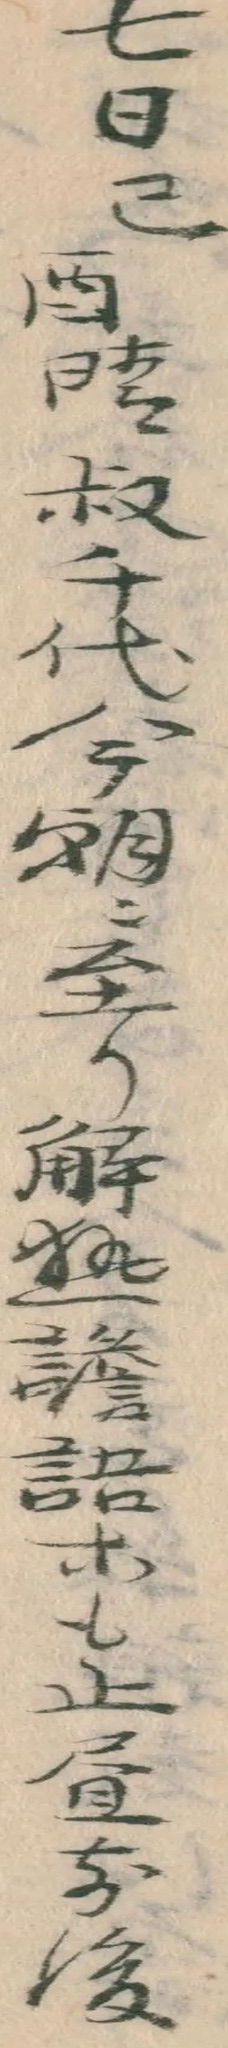七日己酉晴叔千代今朝ニ至リ解熱譫語等も止昼前後
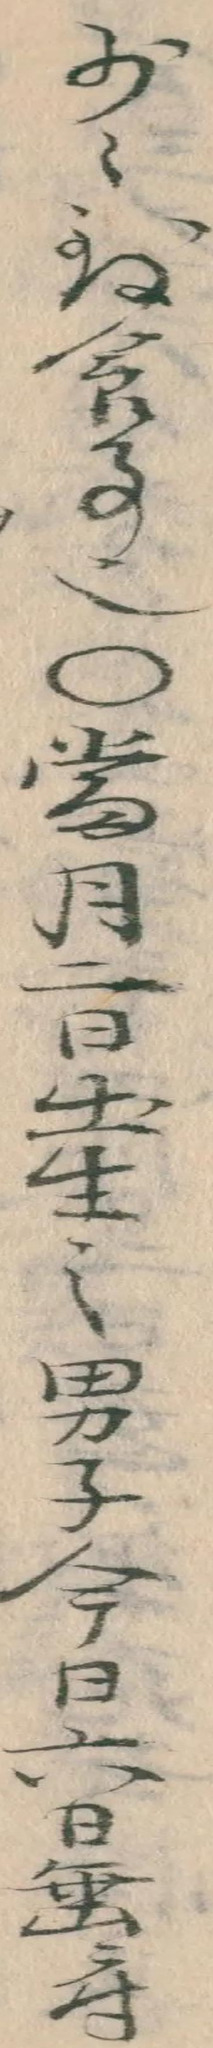少々致食事也○當月二日出生之男子今日六日垂ニ付
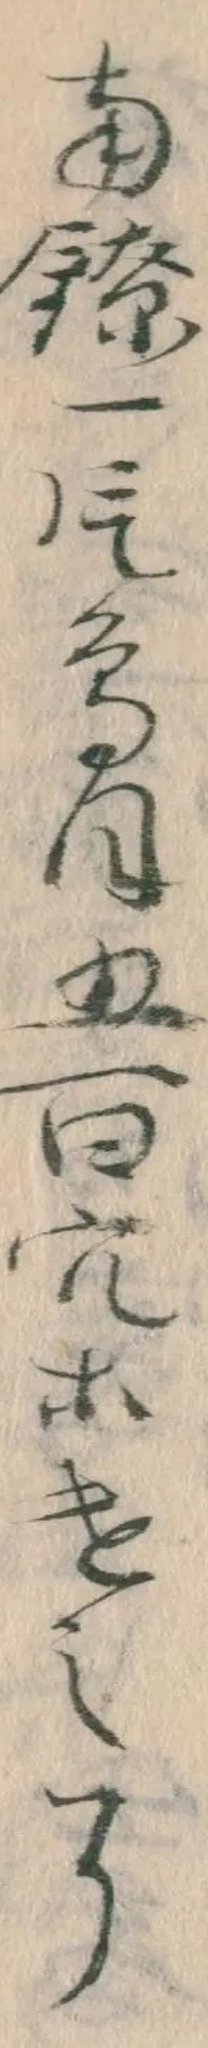南鐐一片鳥目五百穴等遣之了
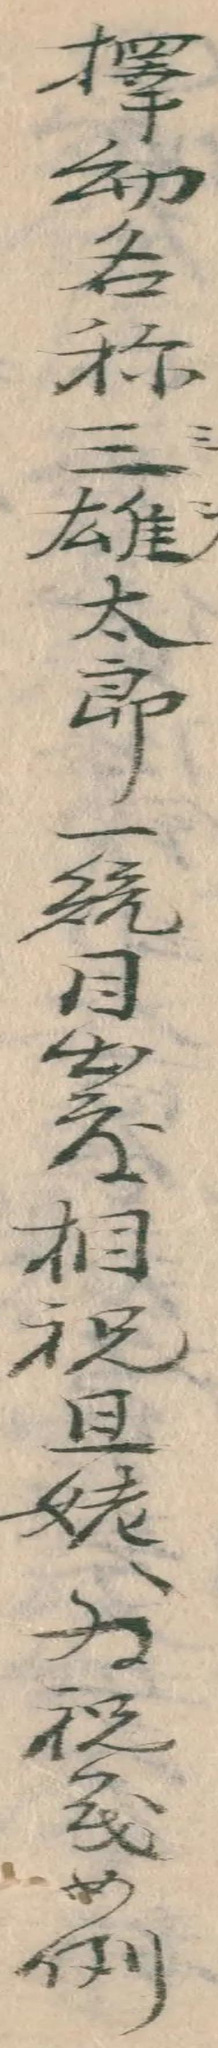擇幼名称三雄太郎一統目出度相祝且姥へ為祝義如例
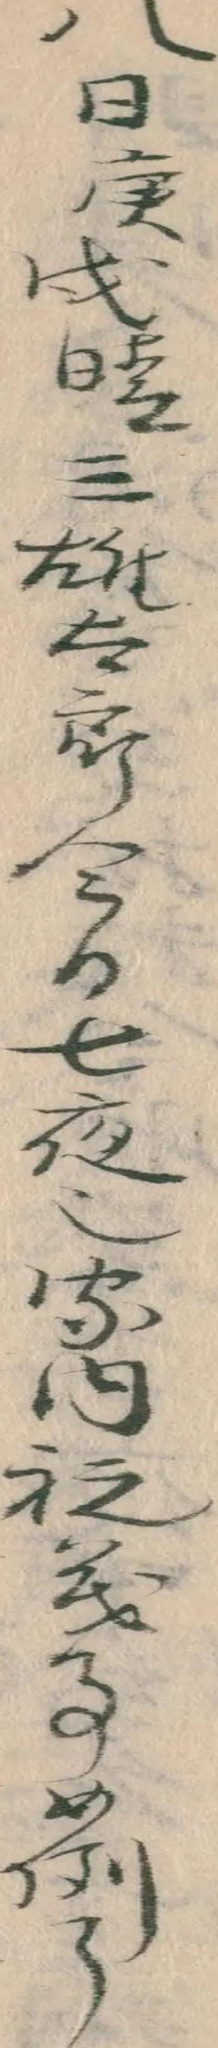八日庚戌晴三雄太郎今日七夜也家内祝義事如例に
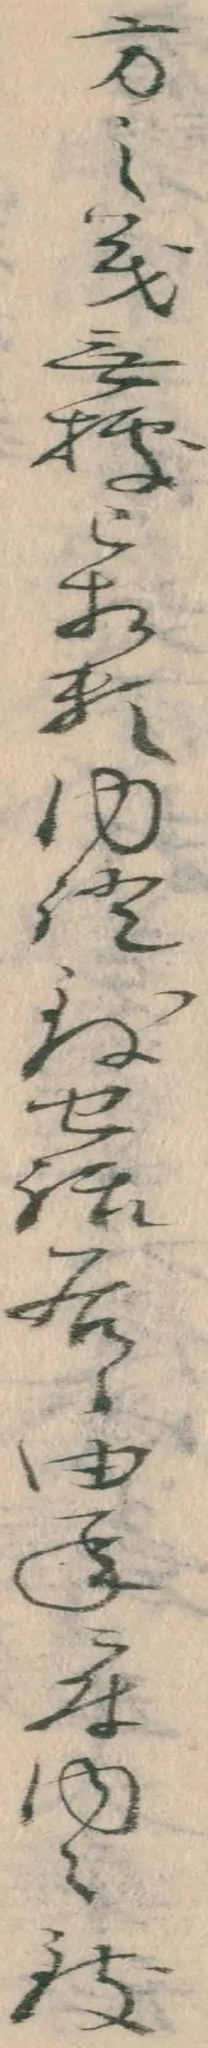方之義無拠被相頼内證致世話居候由承ニ付内々致
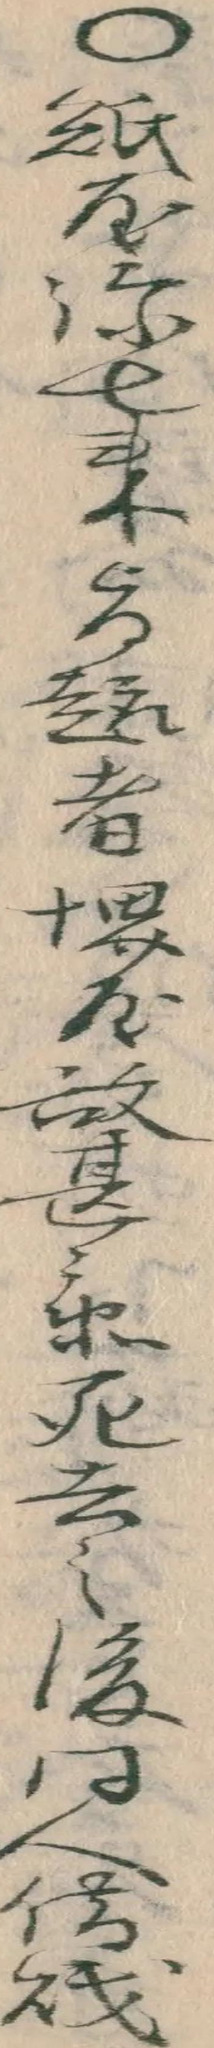〇紙屋弥七来旨趣者堺屋政甚兵衛死去之後同人借財
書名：賀茂社記録. 第63冊
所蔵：国立国会図書館 National Diet Library, JAPAN
